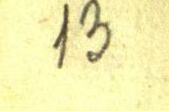13
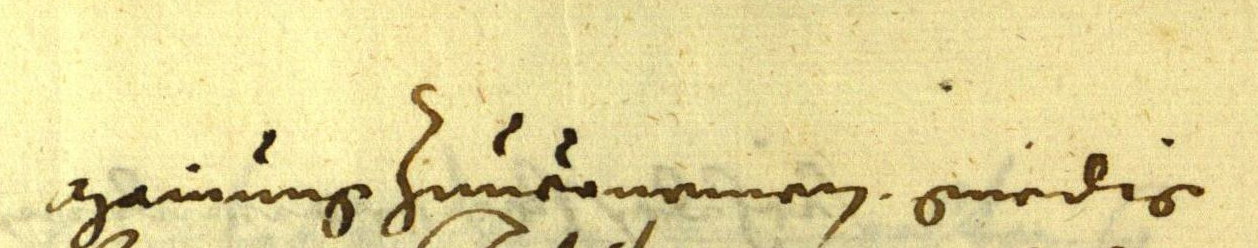Mainūng Zūuērnemen. gnedigs
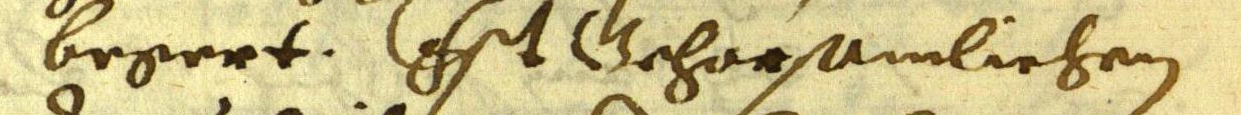begert. Ist Gehorsamlichen
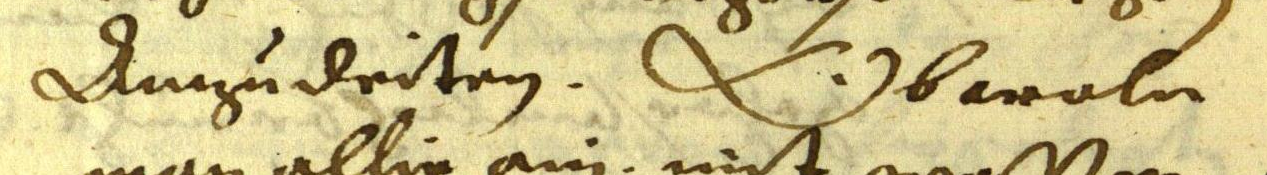Anzūdeiten. Obwoln
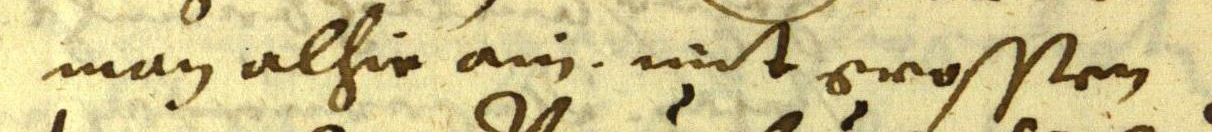man alhie ain. mit grossen
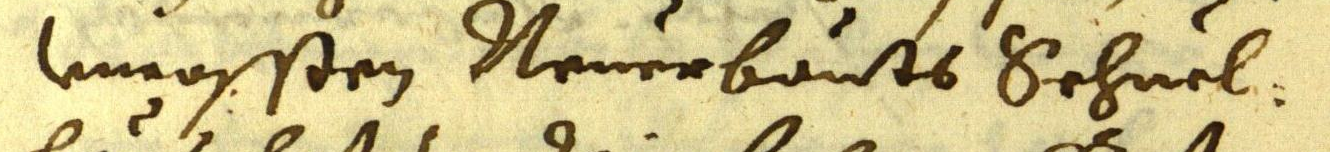Vncossten Neūerbaūts Schūel¬
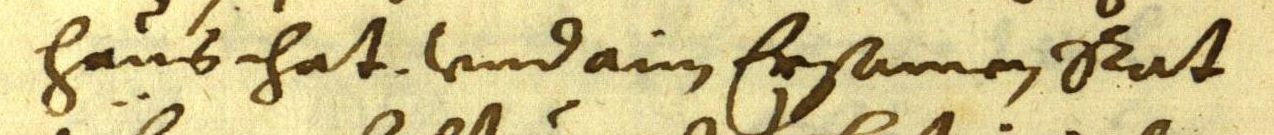haūs hat. vnd aim Ersamen Rat
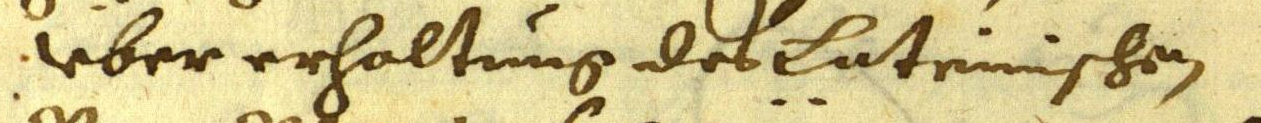v̈ber erhaltūng des Lateinischen
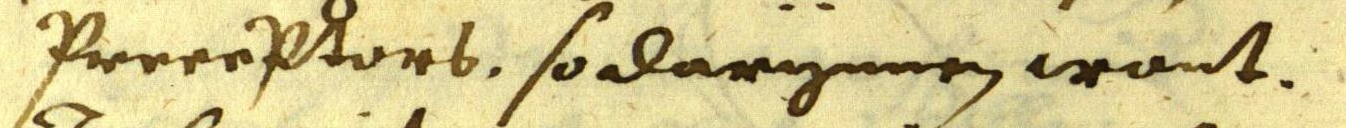PrecePtors. so darÿnnen wont.
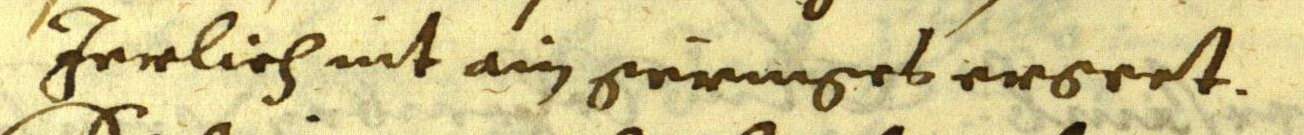Jerlich nit ain geringes ergeet.
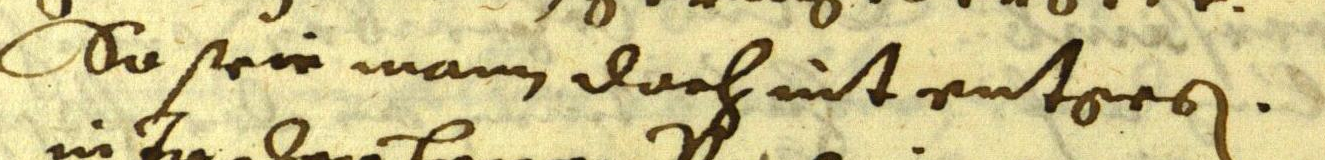So seie mann doch nit entgeg
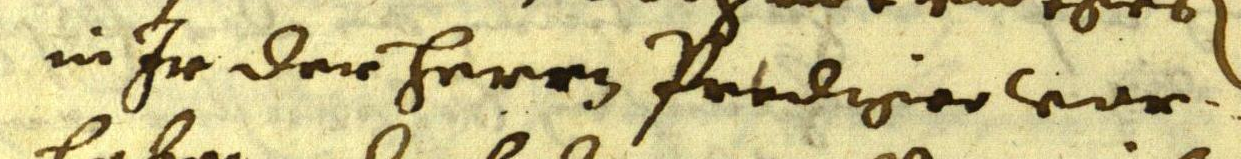in Ir der Herrn Prediger vor¬
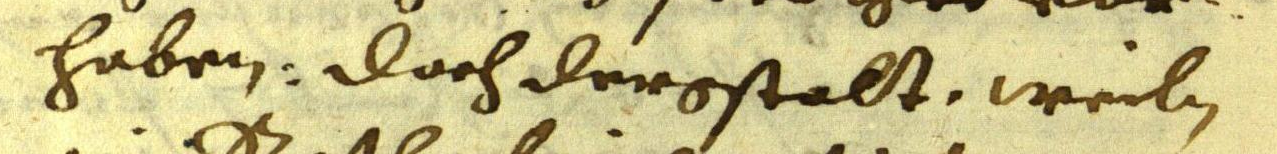haben. doch dergstalt. weiln
